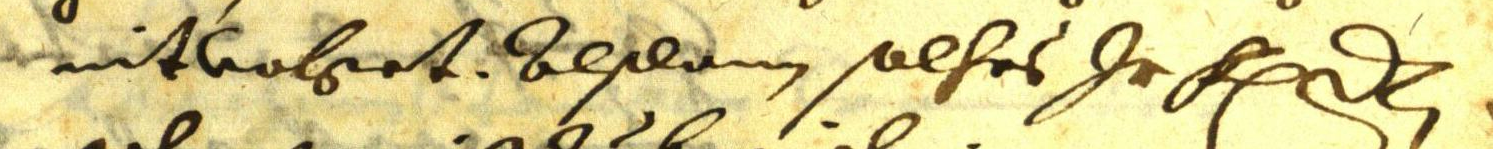nit volget. Alsdann solhes Ir F dt
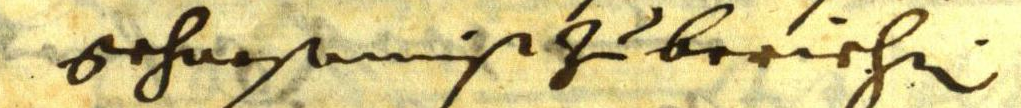gehorsamist Zū bericht.
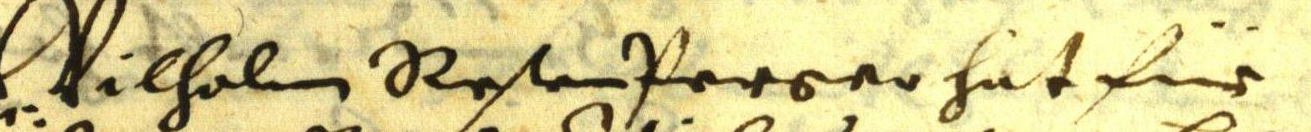Wilhalm ResenPerger hat für
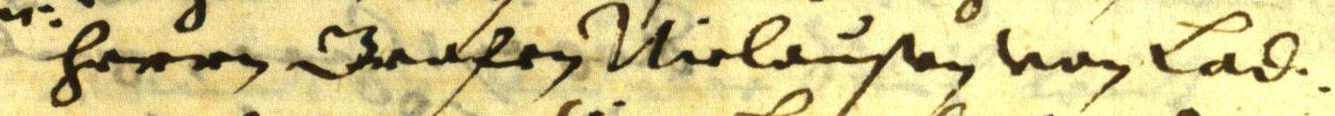herrn Grafen Niclaūsen von Lod¬
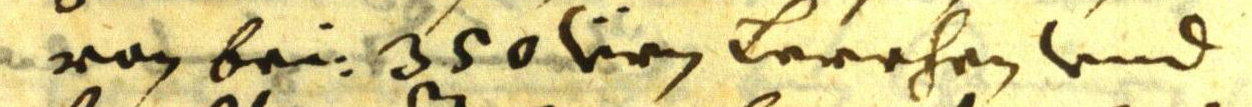ron bei: 350 v̈rn Lerchen vnd
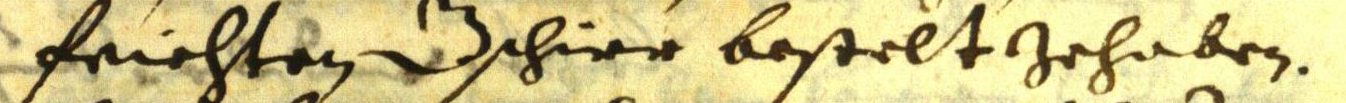feichten Gschirr bestelt Zehaben.
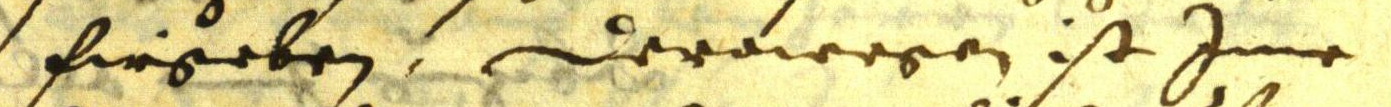firgeben. Derowegen ist Ime
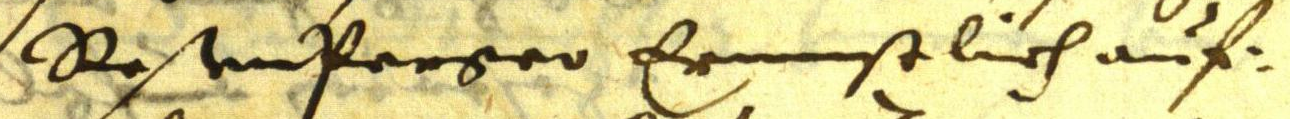Resenperger Ernnstlich aūf¬
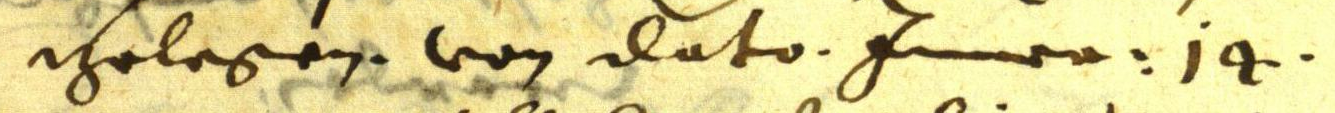zelegen. von dato. Inner: 14.
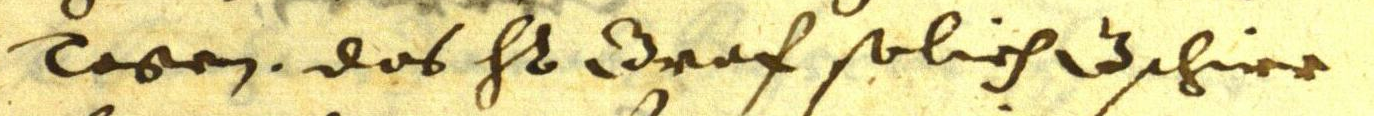Tagen. das h Graf solich Gschirr
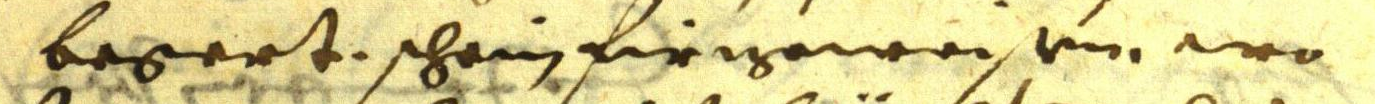begert. schein firzeweisen. wo
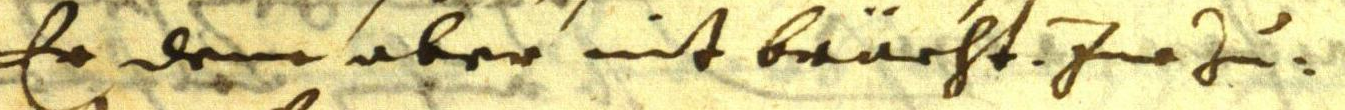Er deme aber nit brächt. Ime Zū¬
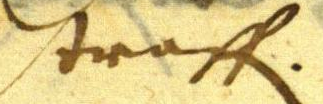straff.
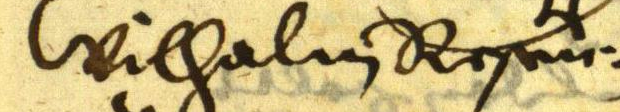Wilhalm Resen¬
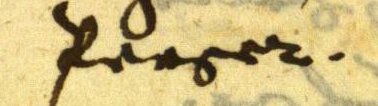Perger.
